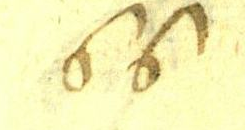66
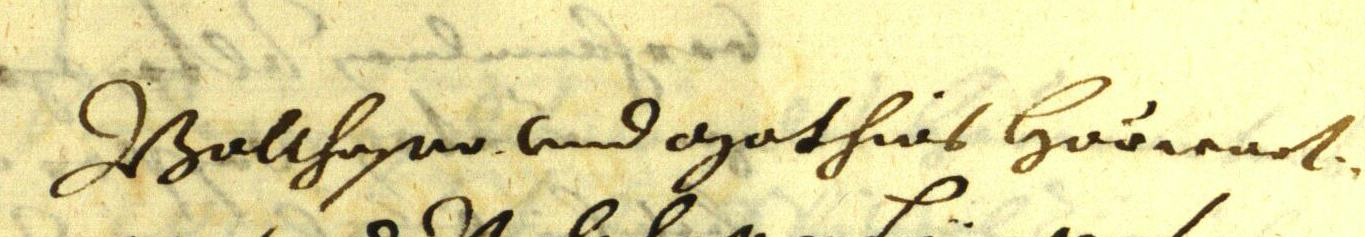Balthasar. vnd Mathias Hōrwart¬
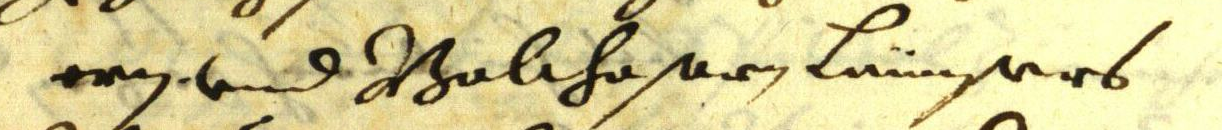ern. vnd Balthasar Lännsers
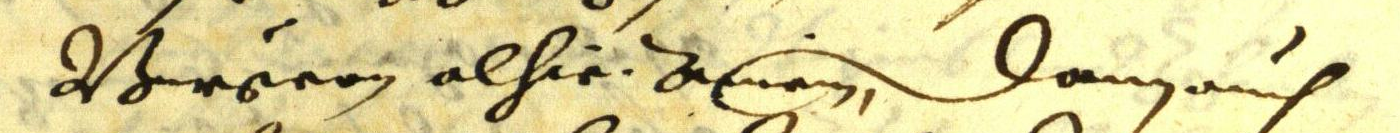Būrgern alhie. Ainem, Dann aūch
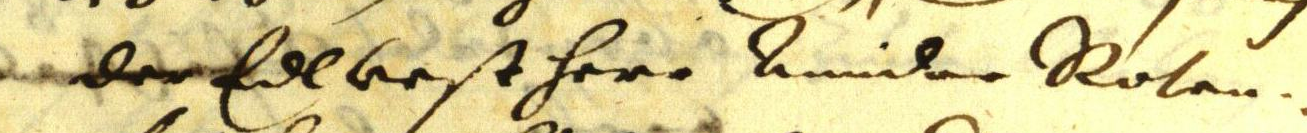der Edl vest herr Anndre Roten¬
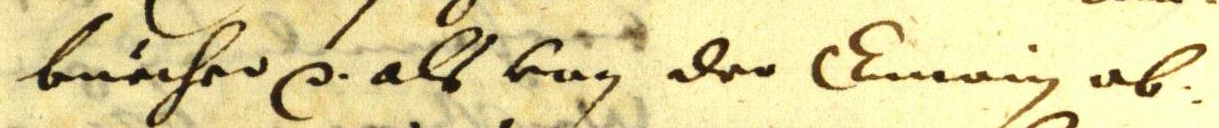būecher etc. als von der Gmain ob¬
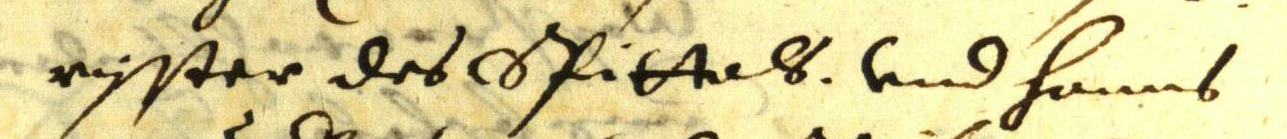risster es Spittals. vnd hanns
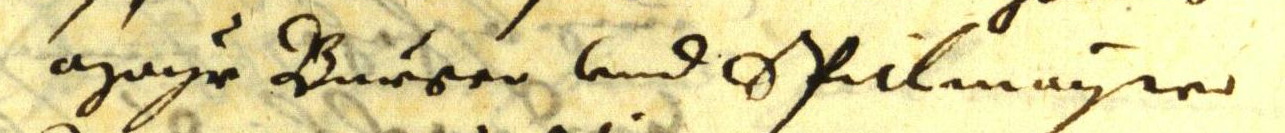Maȳr Būrger vnd SPitlmaister
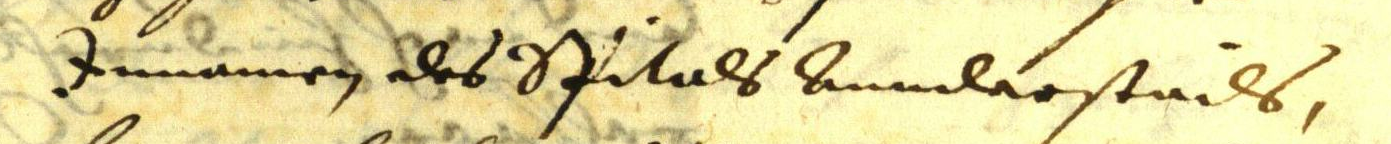Innamen des Spitals Annderstails,
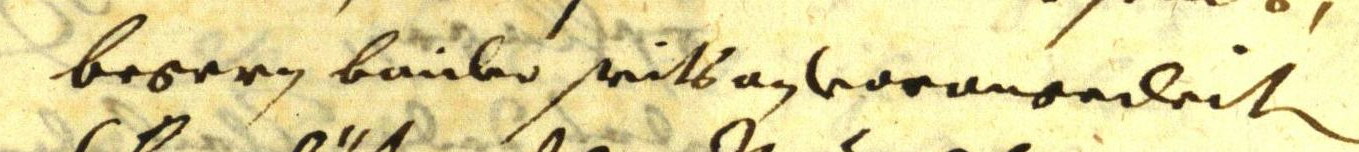begern baider seits an vorangedeit
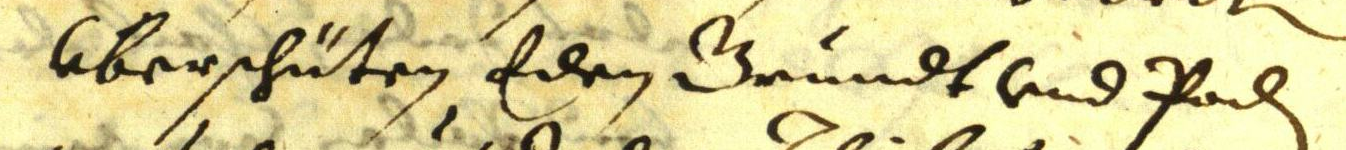v̄berschüten Eden Grūndt vnd Pod.
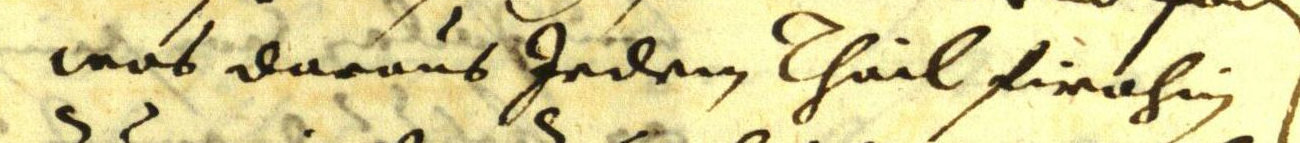was daraūs Jeden Thail firohin
